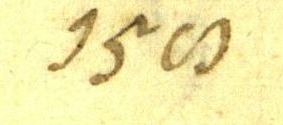158
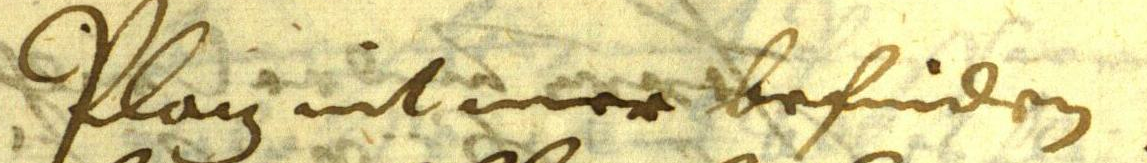Plaz nit mer befinden
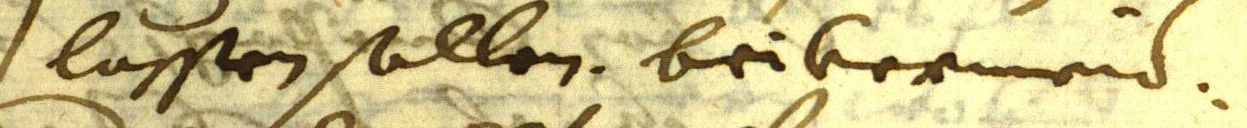lassen sollen. bei vermeid¬
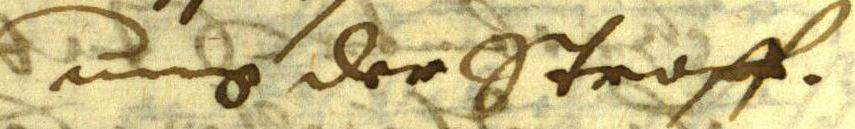ūng der Straff.
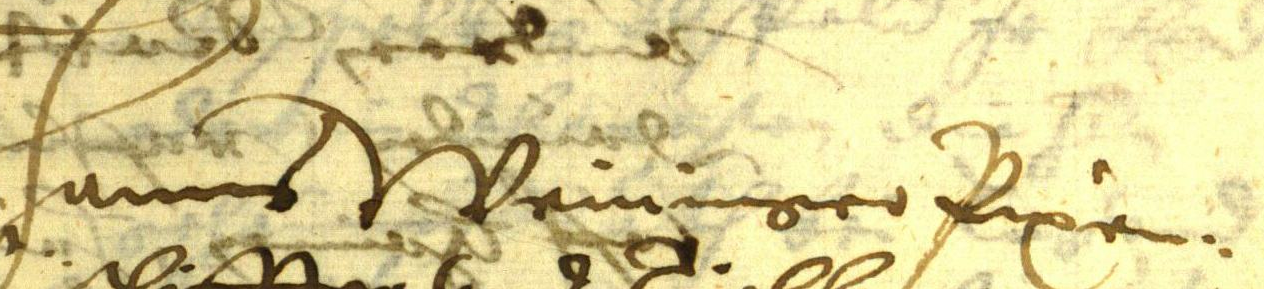hans Weininger Pixen¬
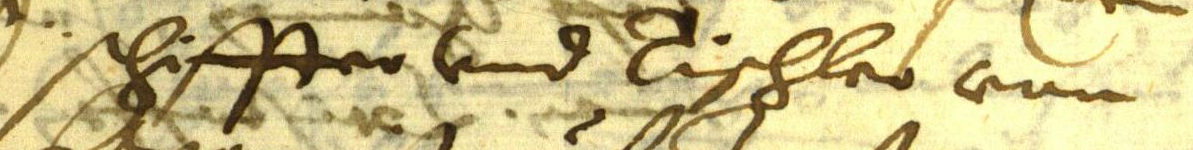schiffter vnd Tischler von
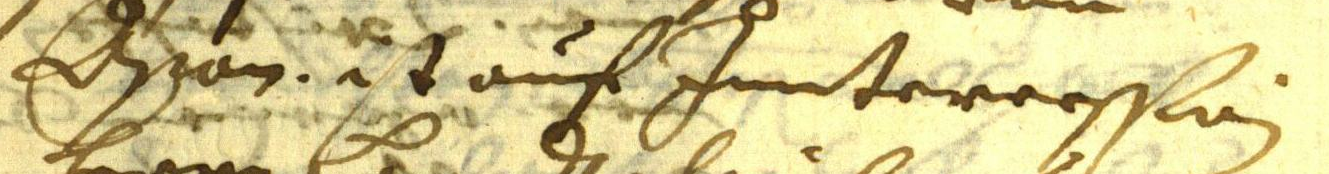Epan. ist aūf Inntercession
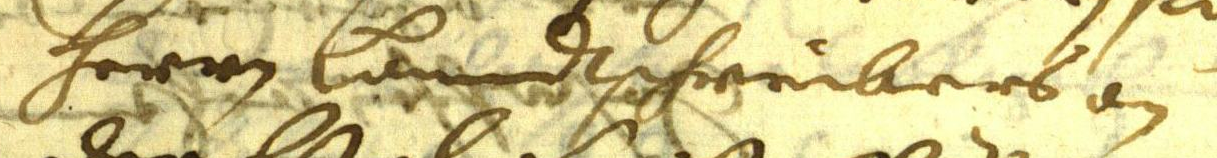herrn Lanndtschreibers an
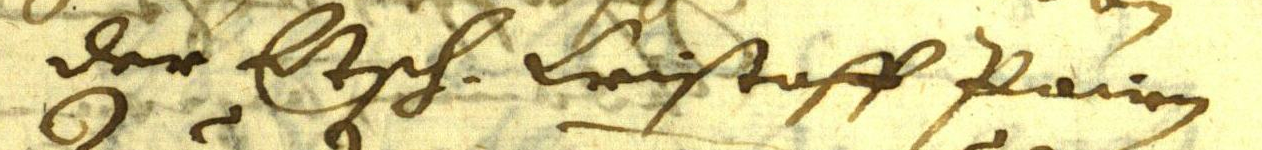der Etsch. Cristoff Pairn
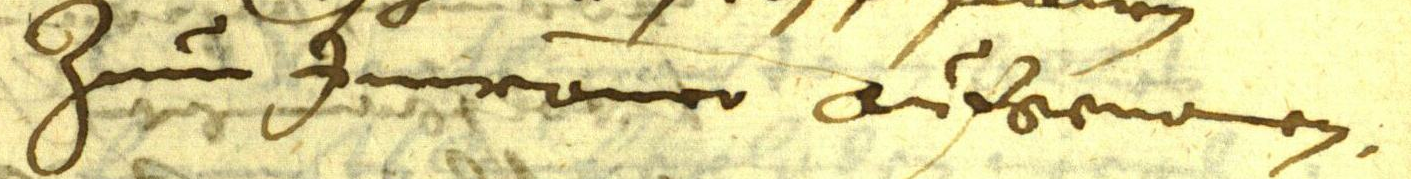Zūm Inwoner aūfgenomen.
